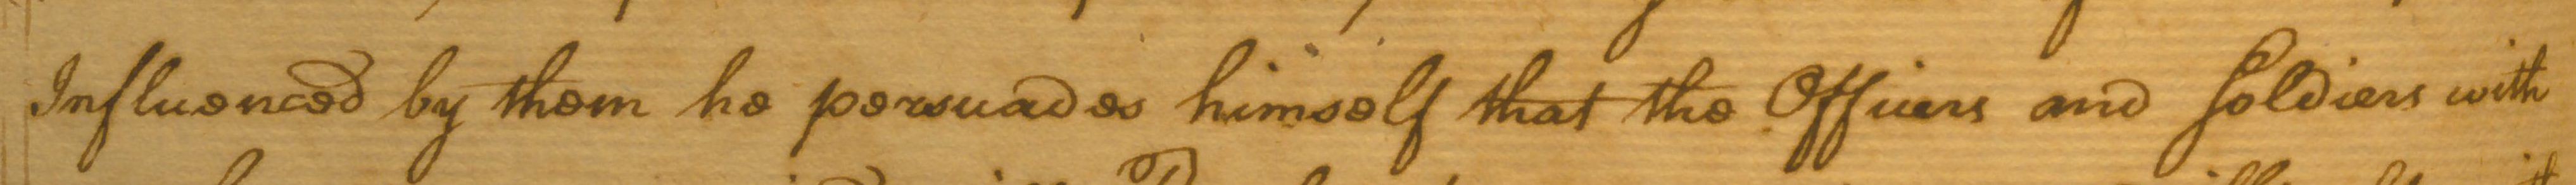Influenced by them he persuades himself that the Officers and Soldiers with
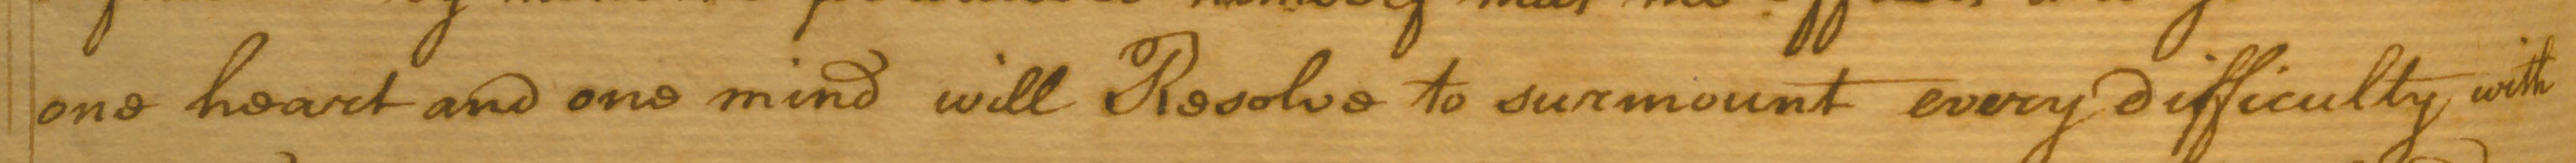one heart and one mind will Resolve to surmount every difficulty with
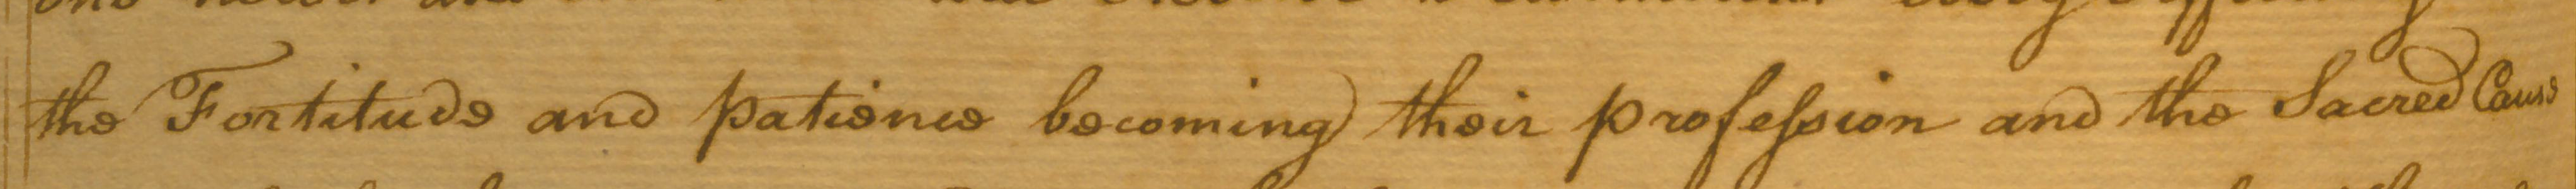the Fortitude and patience becoming their profession and the Sacred Cause
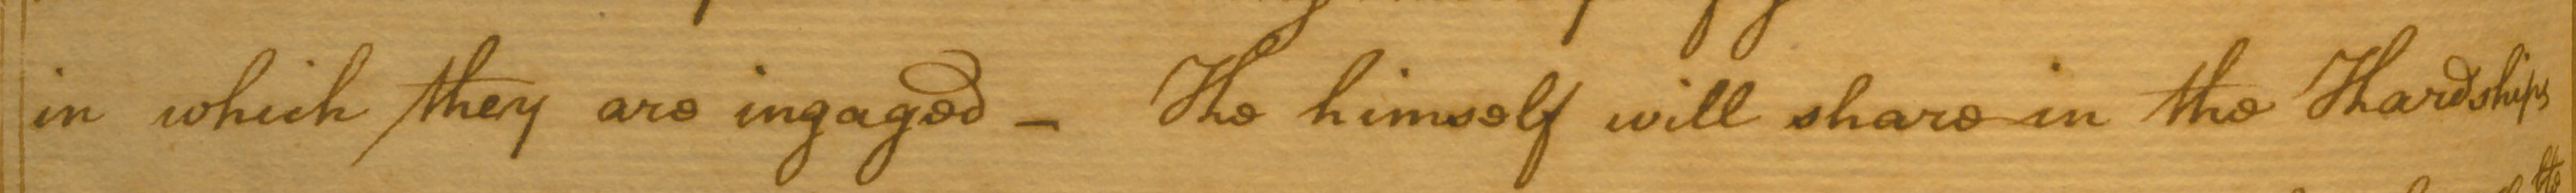in which they are ingaged- He himself will share in the Hardships
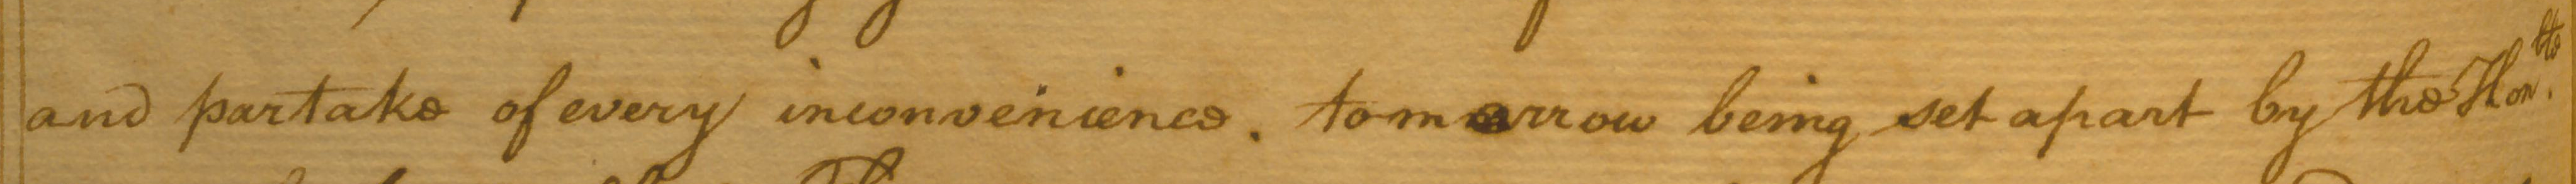and partake of every inconvenience. tomorrow being set apart by the Hon^ble.
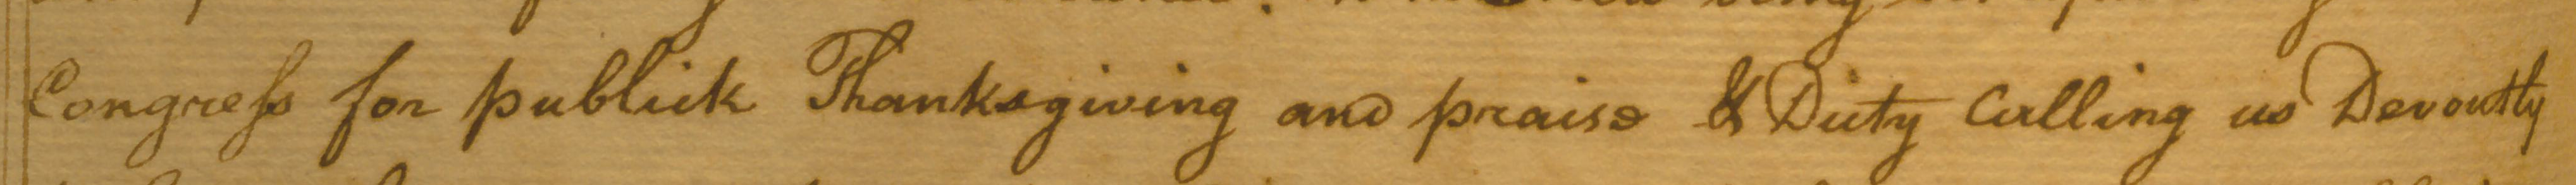Congress for publick Thanksgiving and praise & Duty calling us Devoutly
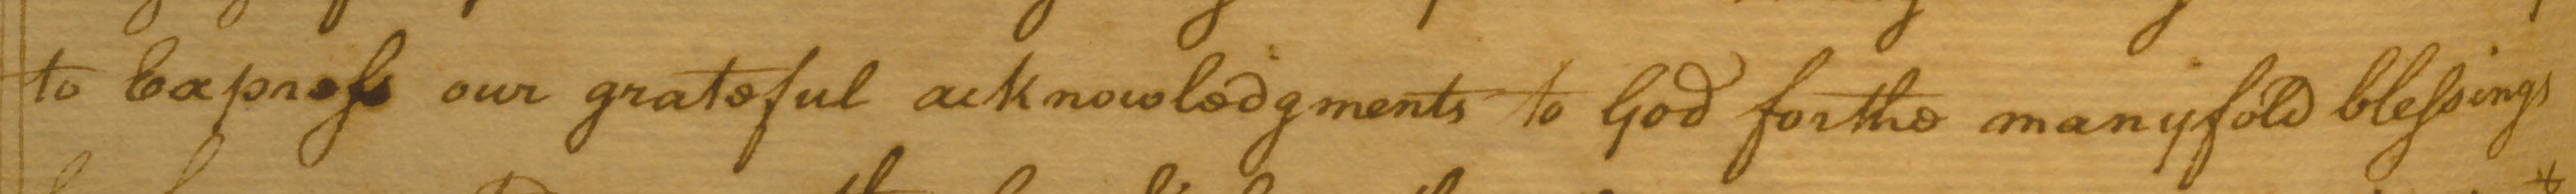to Express our grateful acknowledgements to God for the manifold blessings
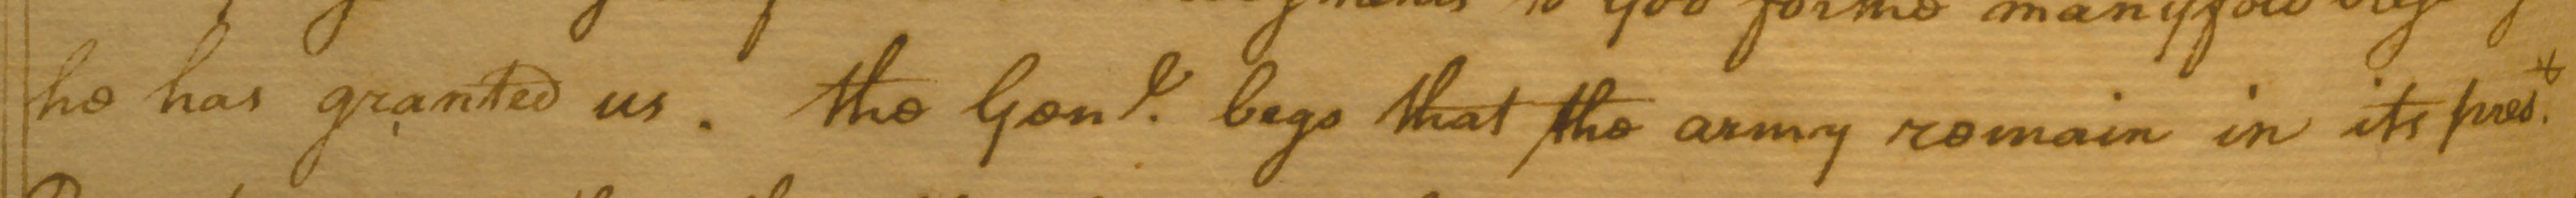he has granted us. the Gen^l. begs that the army remain in its pres^t.
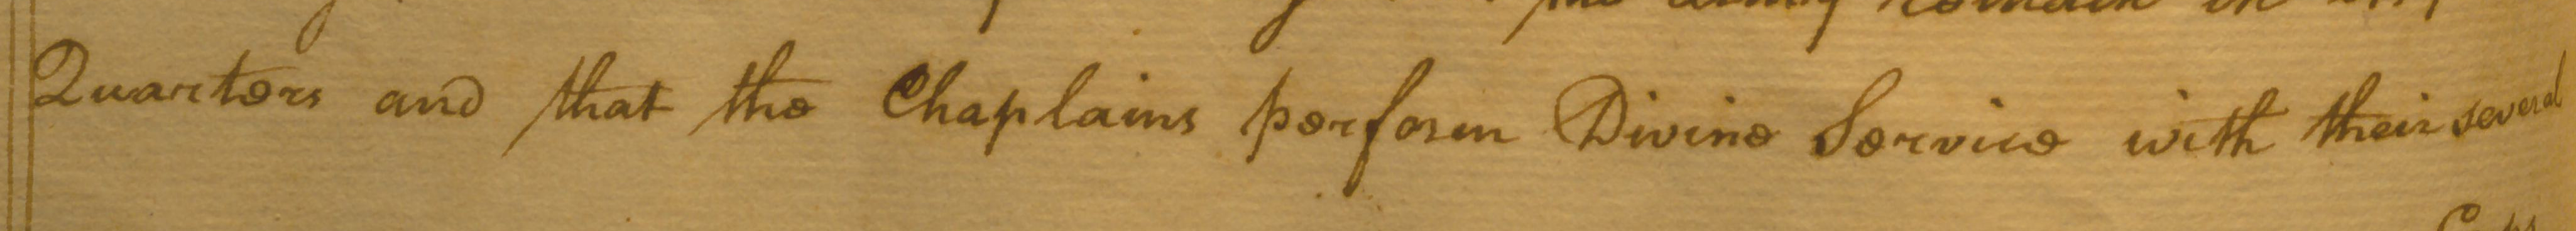Quarters and that the Chaplains perform Divine Service with their sound
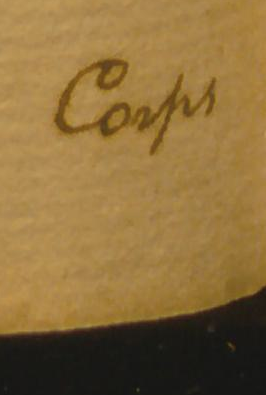Corps
